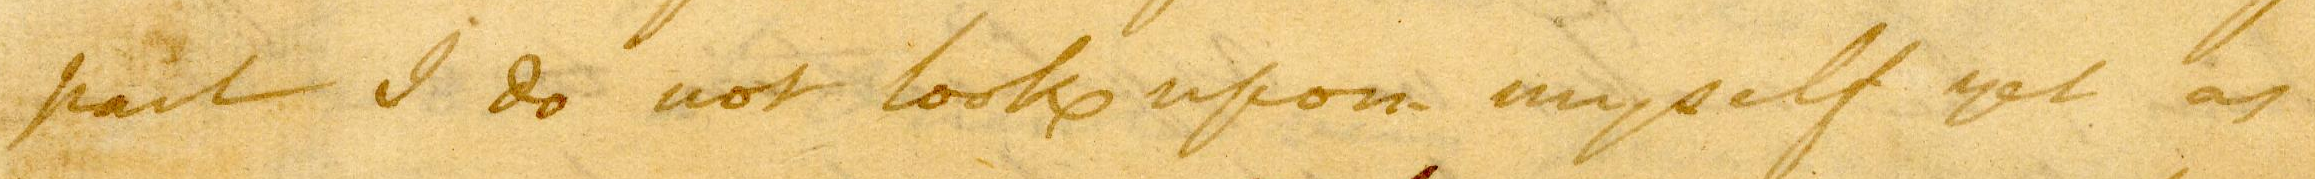part I do not look upon myself yet as
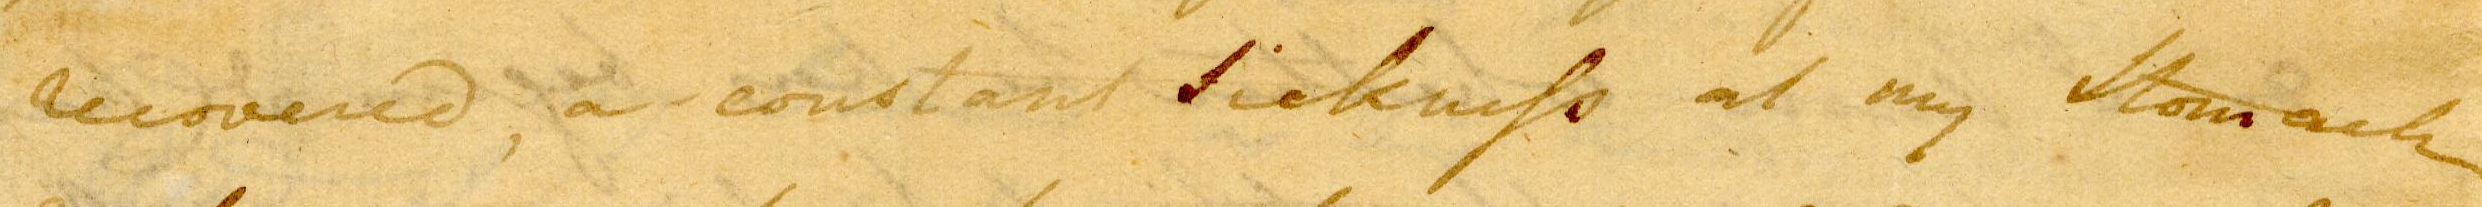recovered a constant sickness at my Stomach
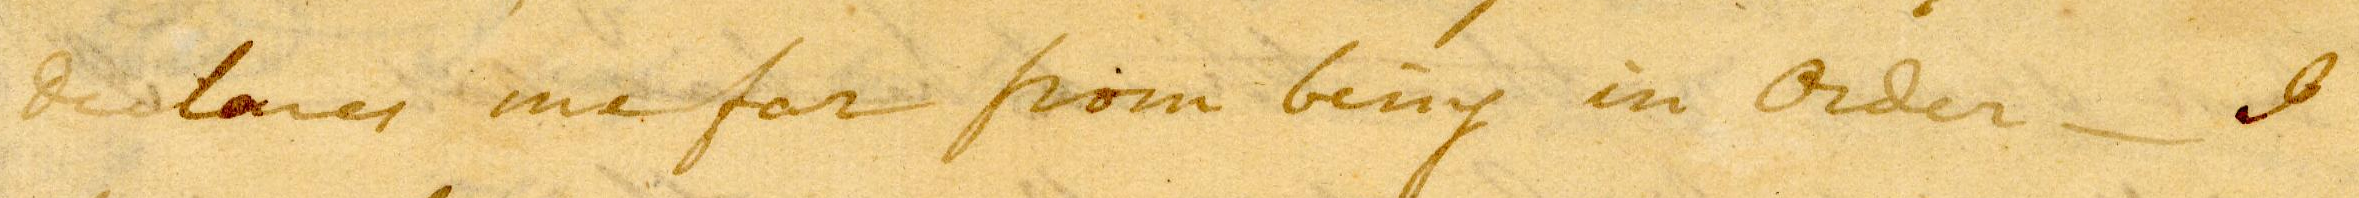declares me far from being in Order. I
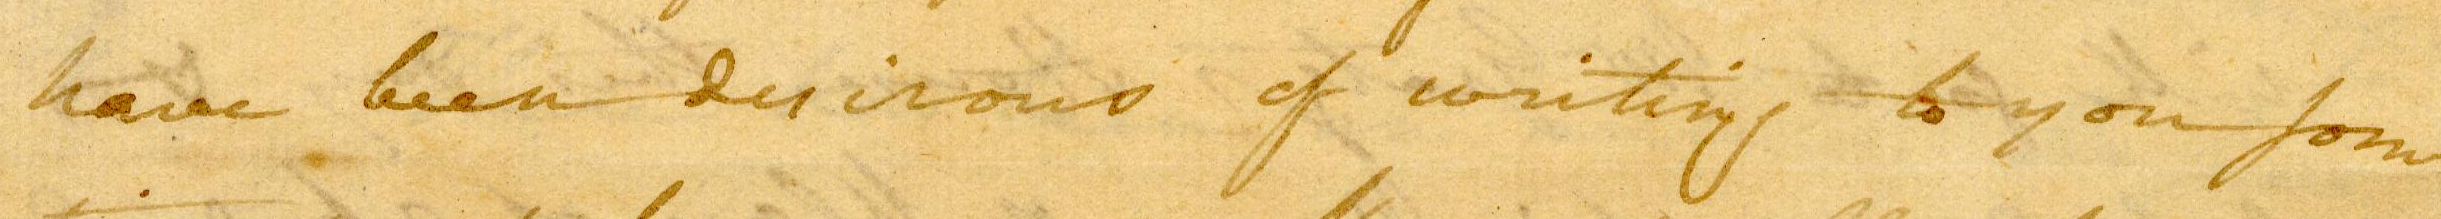have been desirous of writing to you some
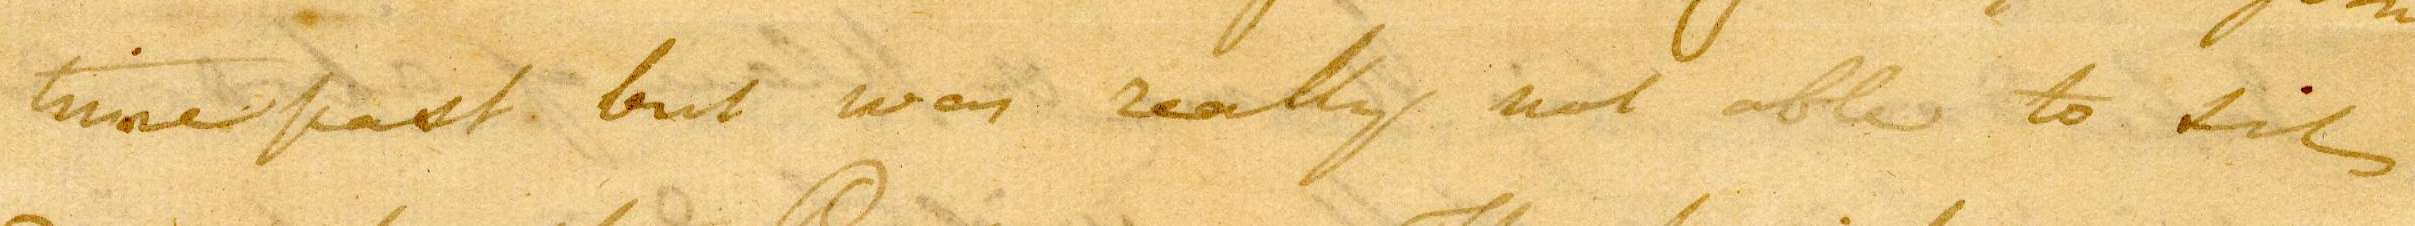time past but was really not able to sit
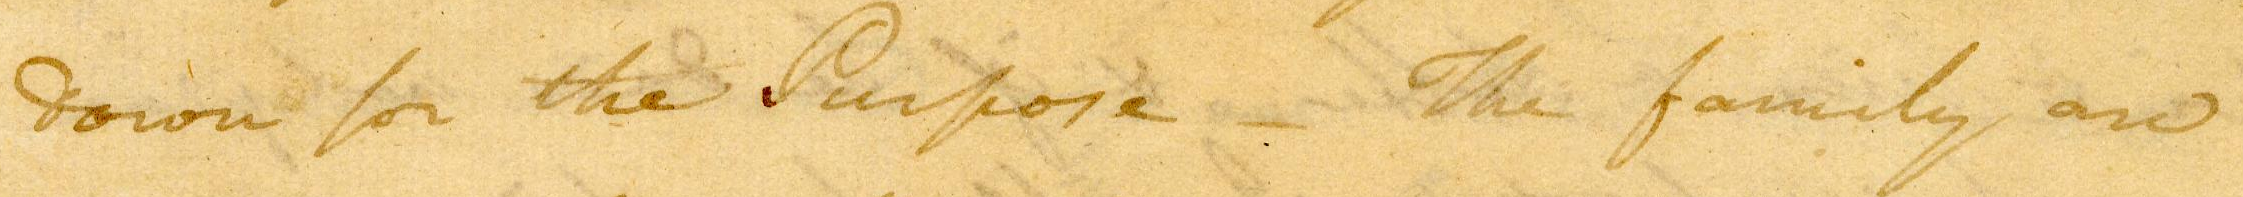down for the Purpose. The family are
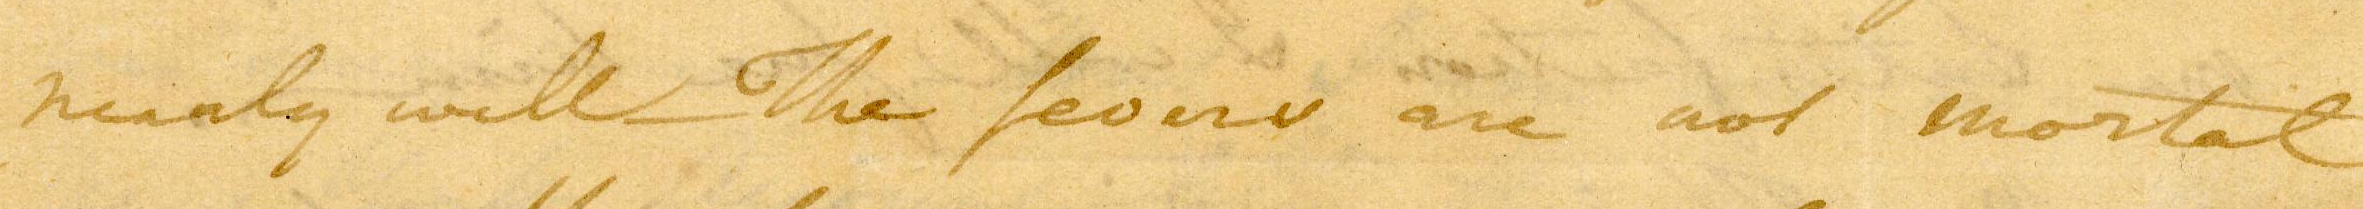really well. The fevers are not mortal
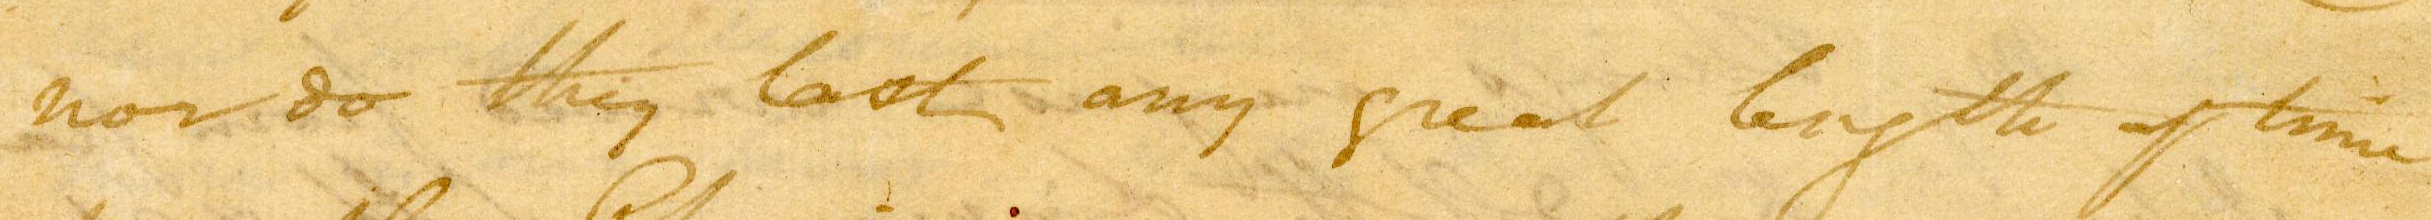nor do they last any great length of time
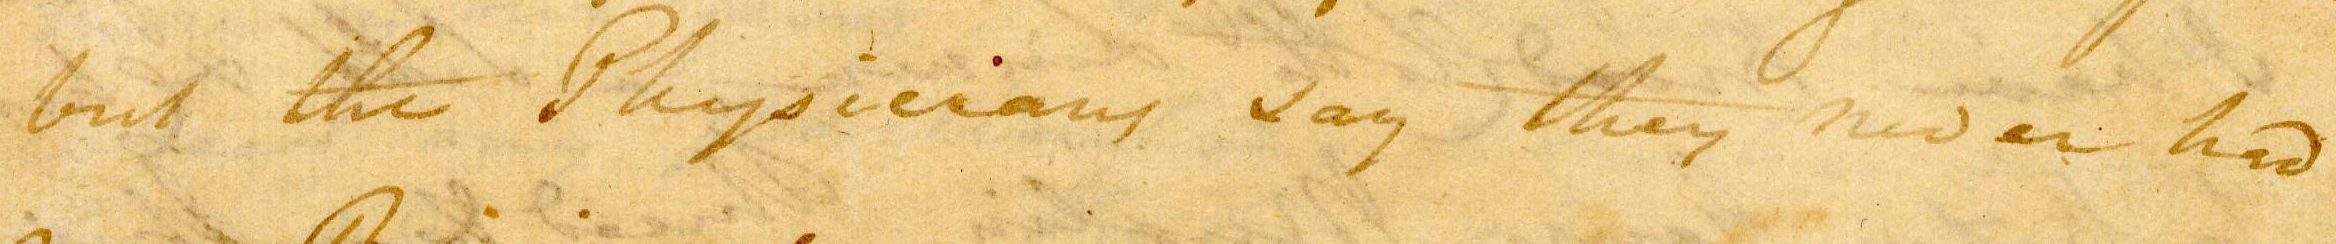but the Physicians say they never had
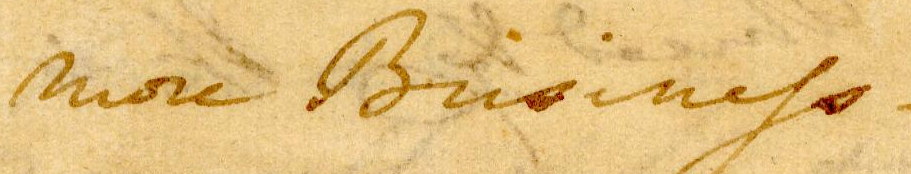more Business.
